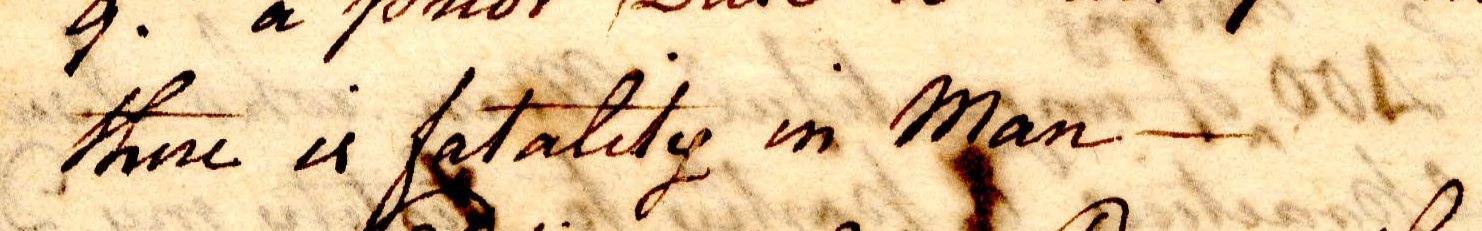there is fatality in Man.
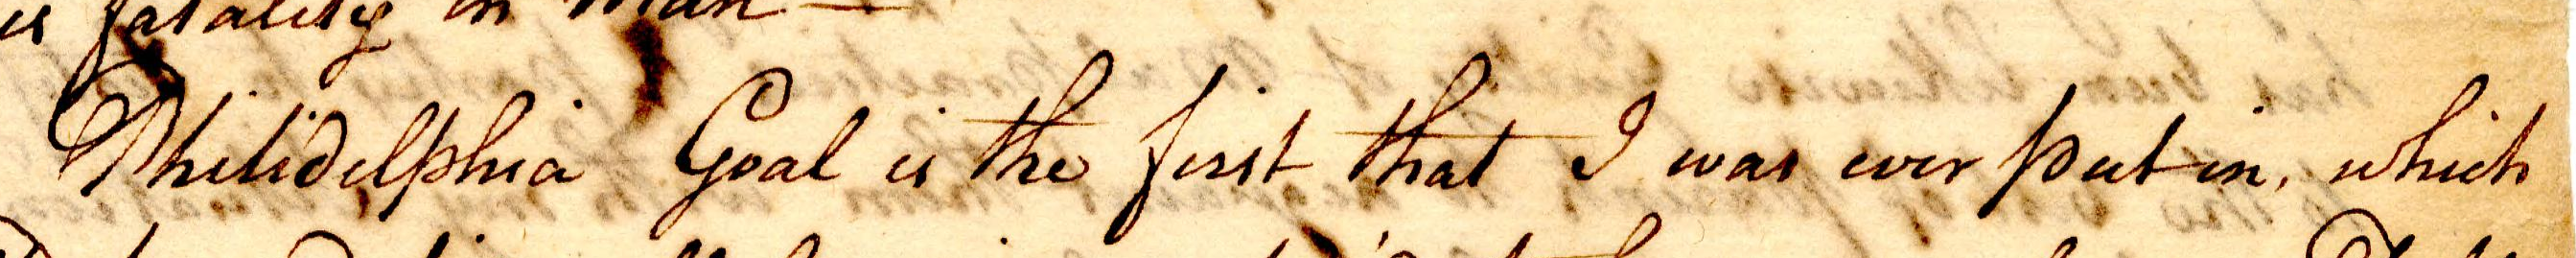Phildelphia Gaol is the first that I was ever put in which
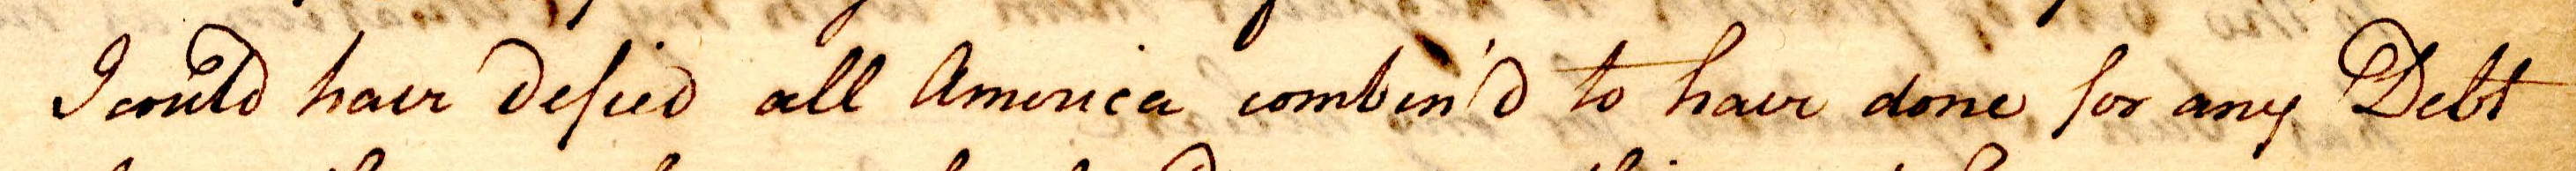I could have defied all America combin'd to have done for any Debt
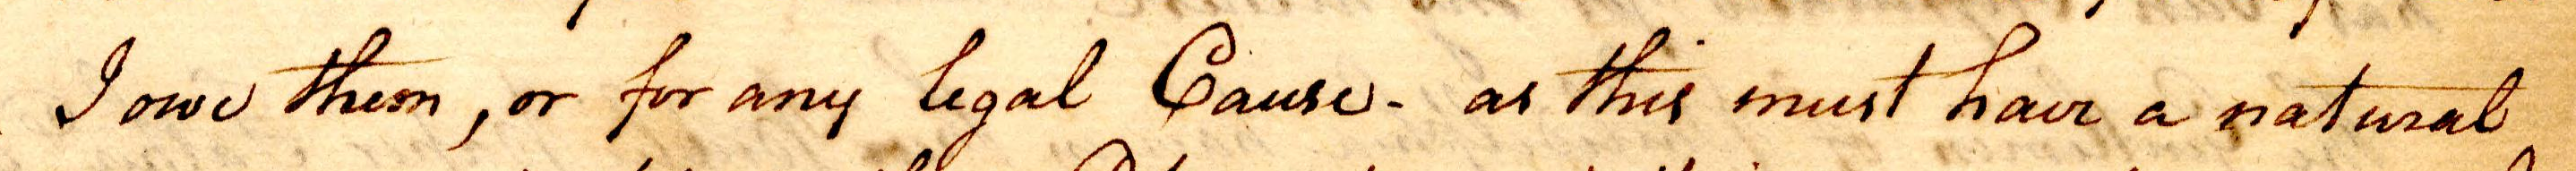I owe them, or for any legal Cause. as this must have a natural
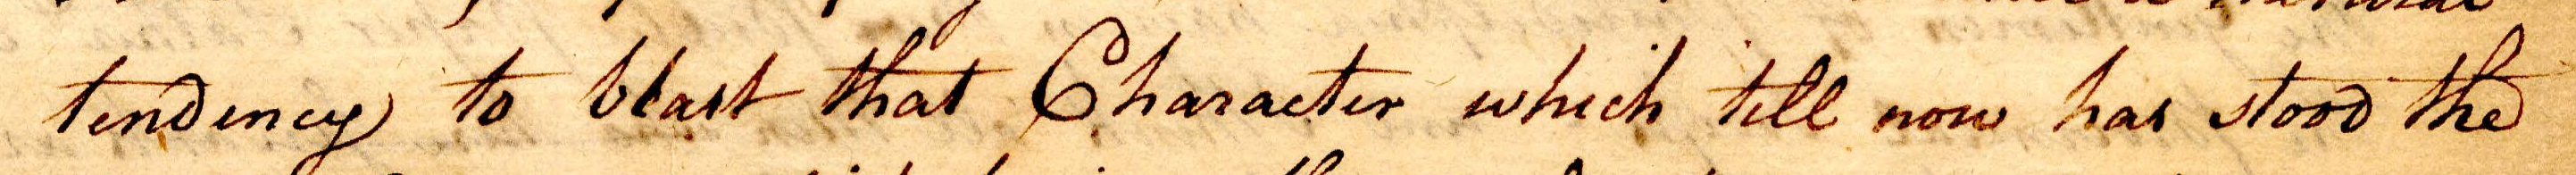tendency to blast that Character which till now has stood the
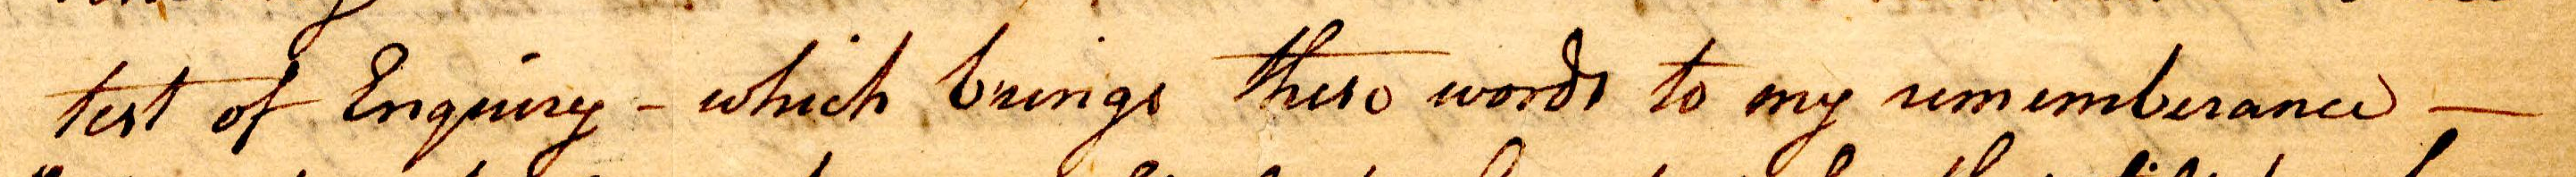test of Enquiry, which brings these words to my rememberance.
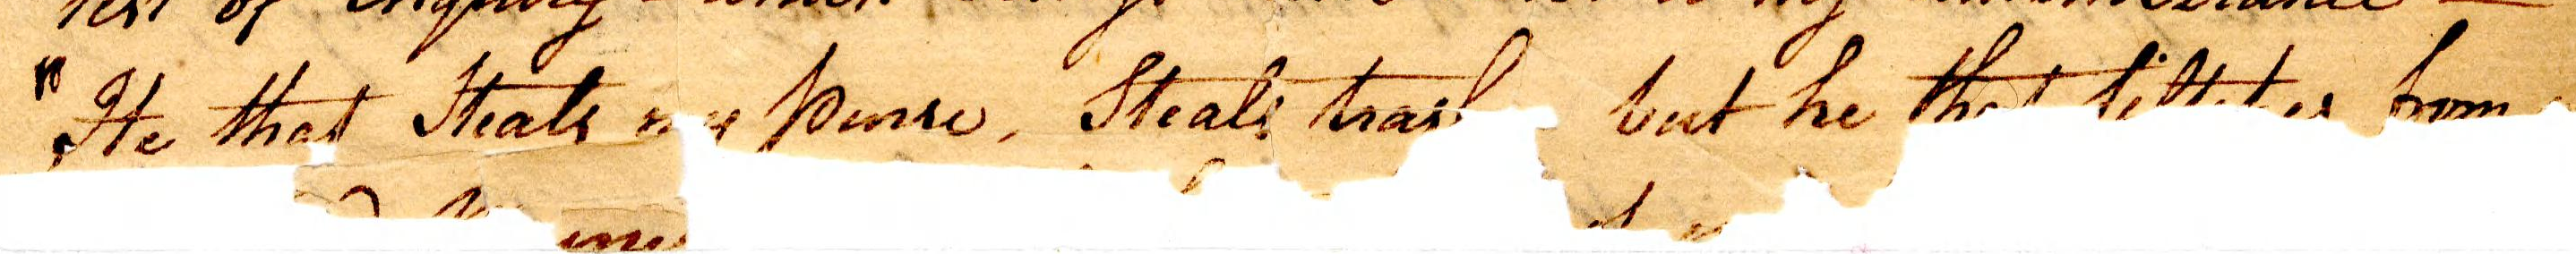"He that Steals my Purse, Steals trash but he that littles from
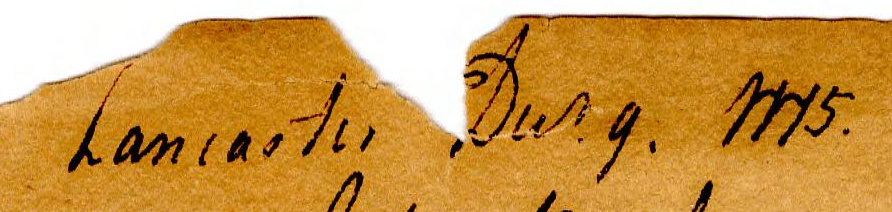Lancaster Dec^r. 9. 1775.
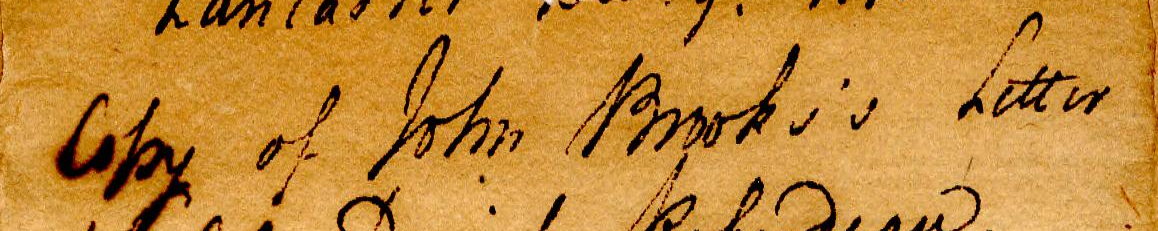Copy of John Brooks's Letter
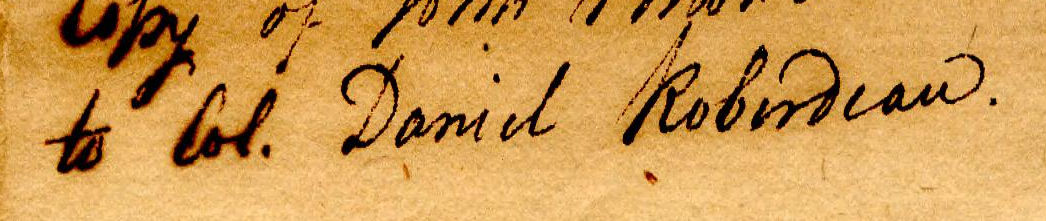to Col. Daniel Roberdeau.
